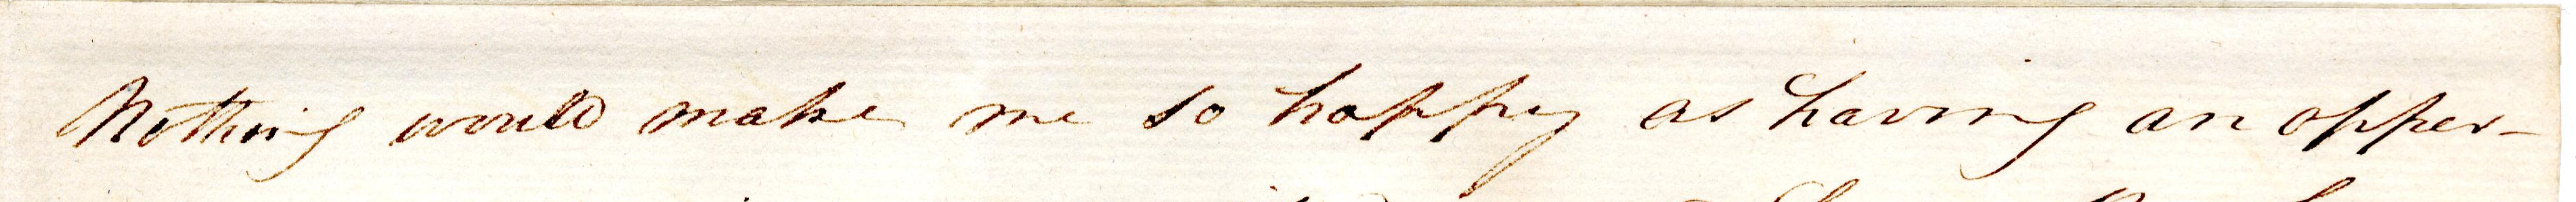Nothing would make me so happy as having an opper-
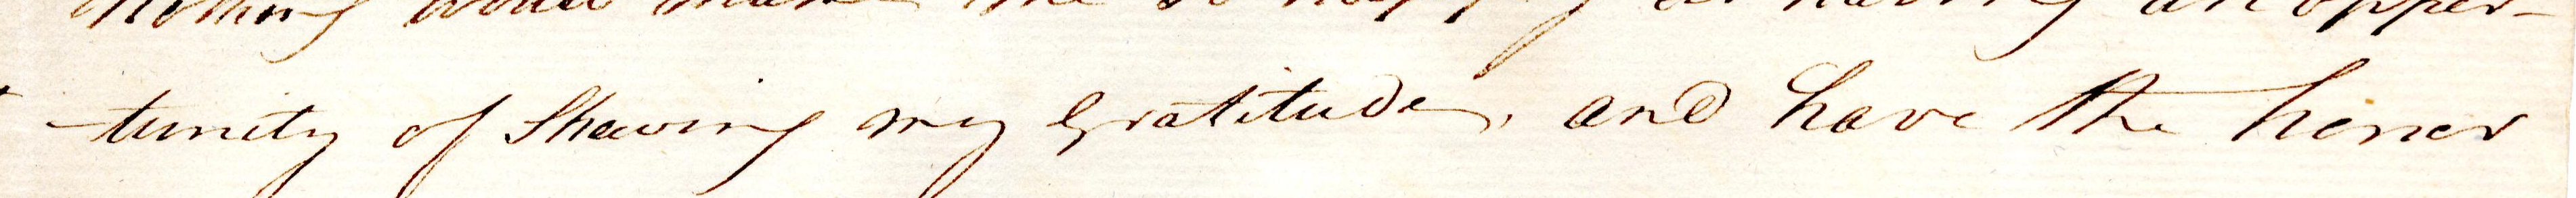-tunity of shewing my Gratitude, and have the honor
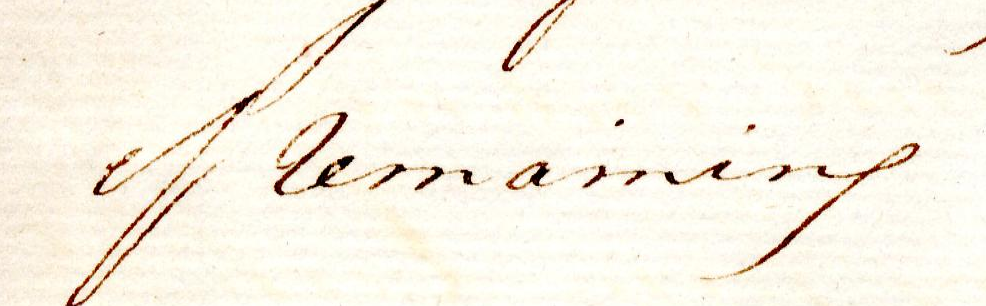of remaining
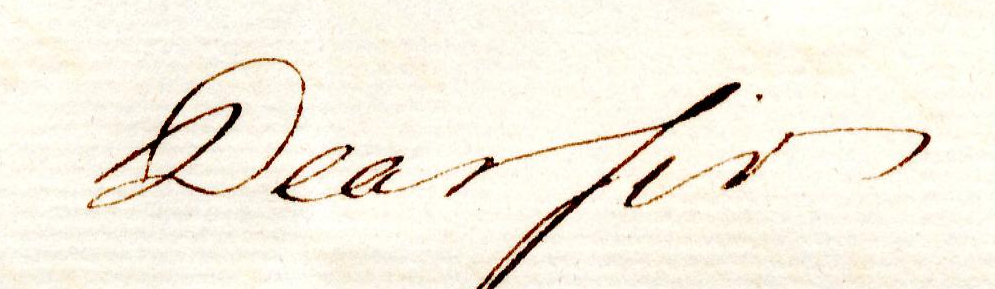Dear Sir
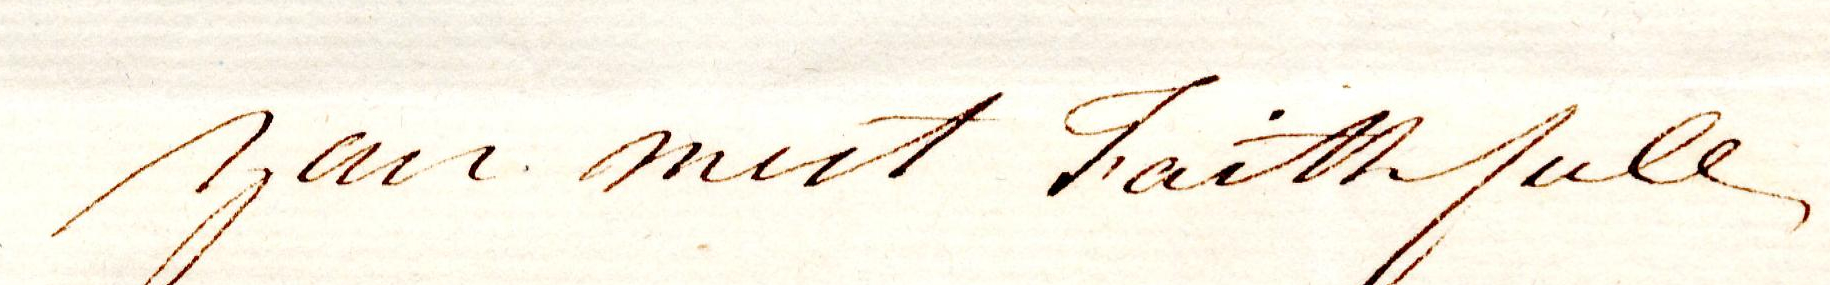your most Faithfull
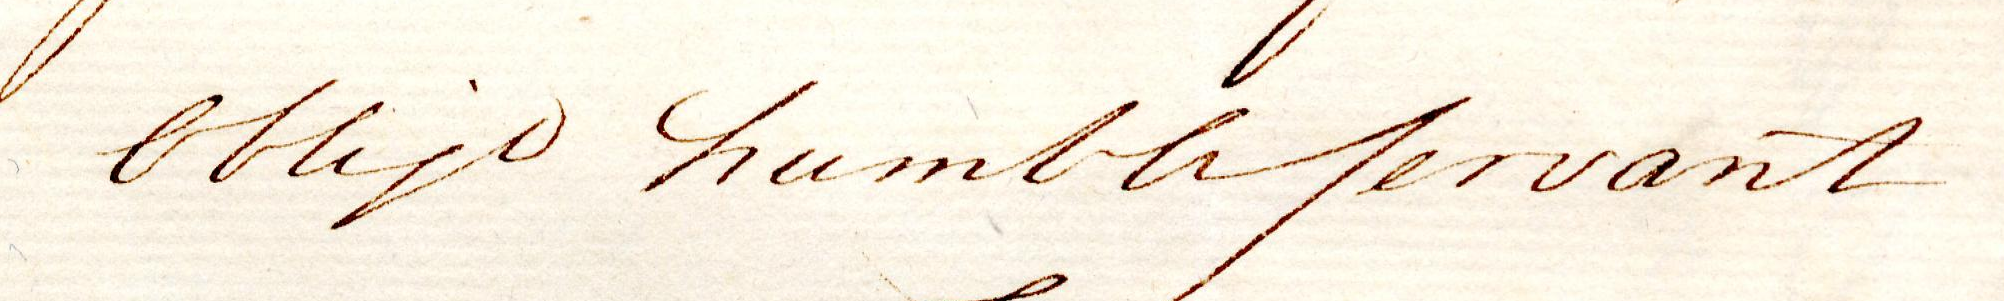Obligd humble servant
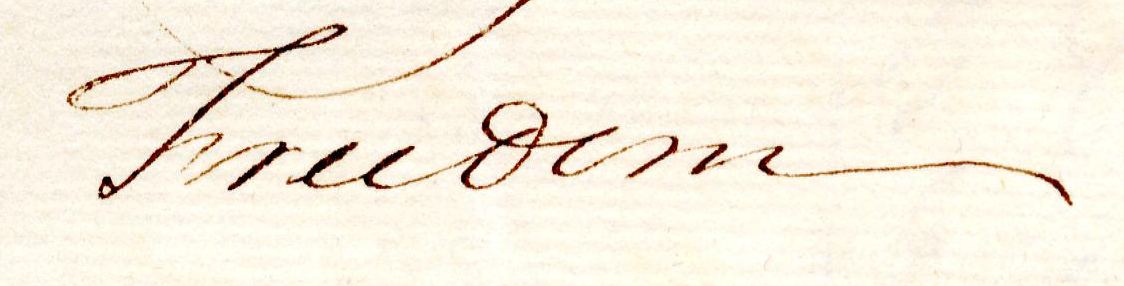Freedom
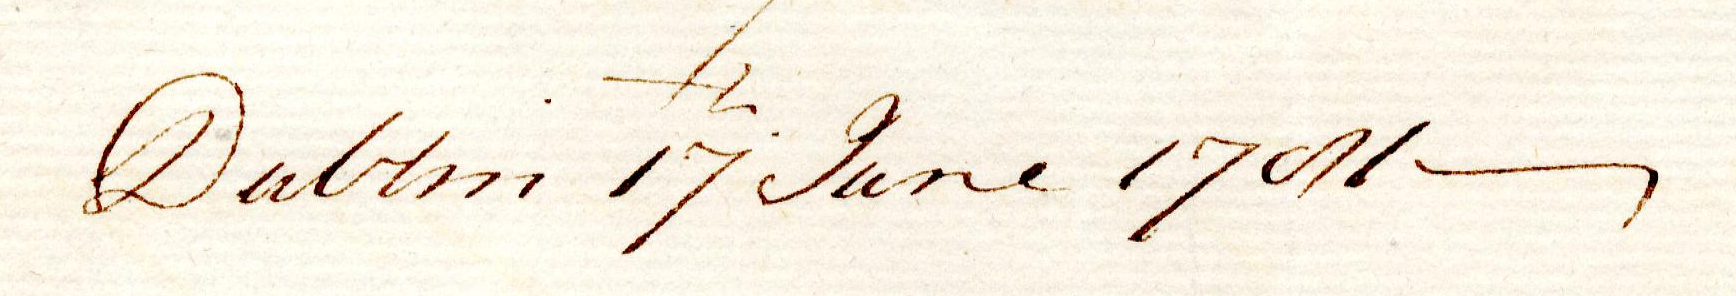Dublin 17^th June 1781-
